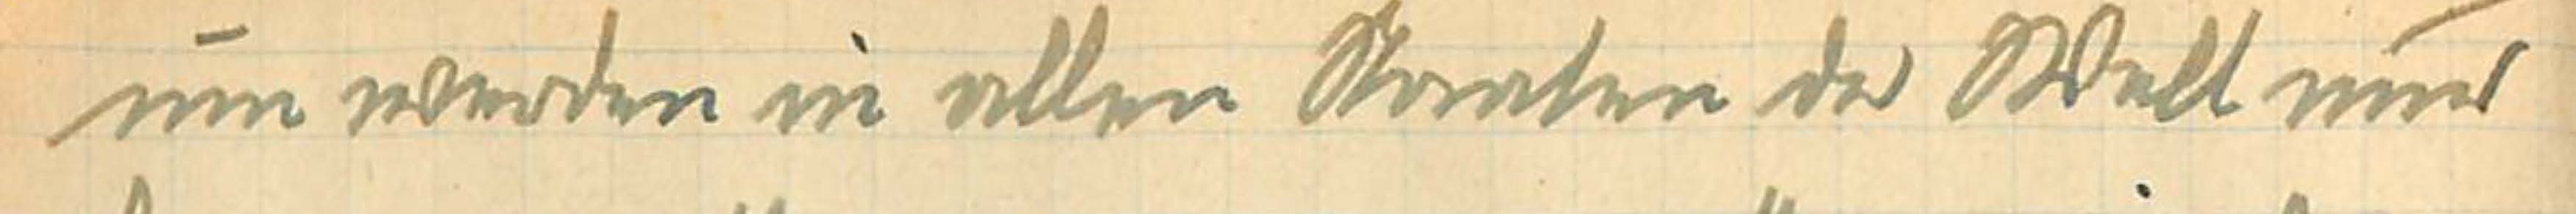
um werden in allen Staaten der Welt nur
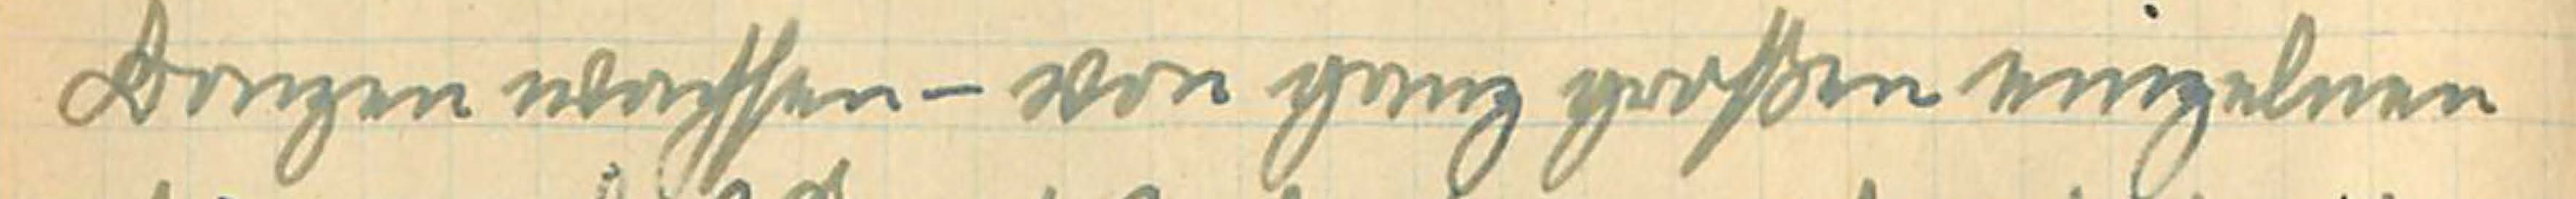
Bonzen wachsen – von ganz großen einzelnen
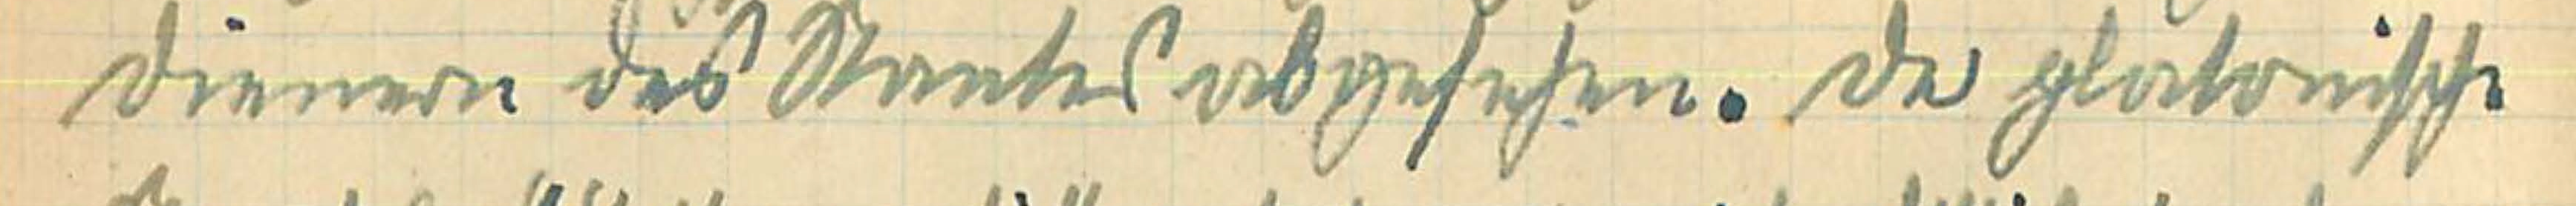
Dienern des Staates abgesehen. Der platonische
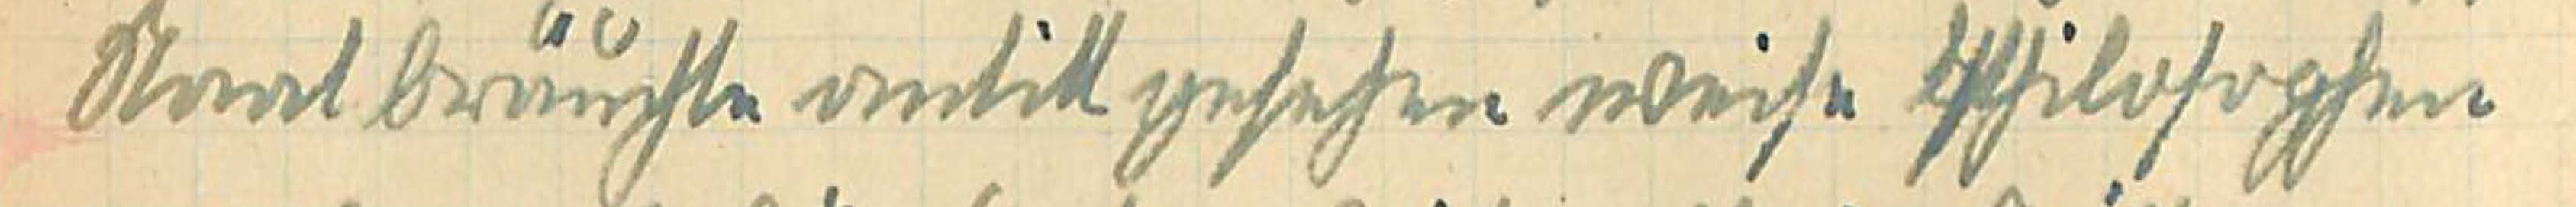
Staat bräuchte antik gesehen weise Philosophen
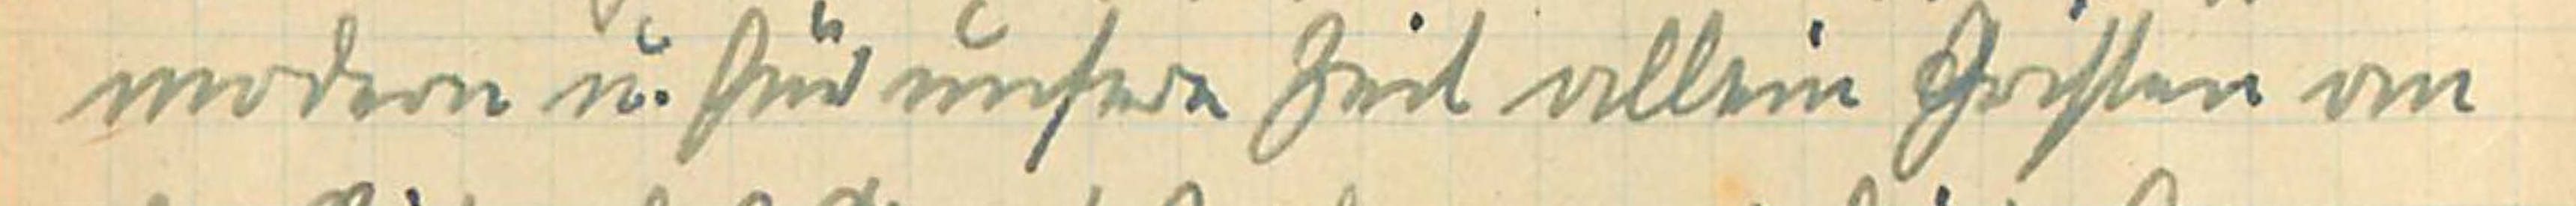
modern u. für unsere Zeit allein Christen an
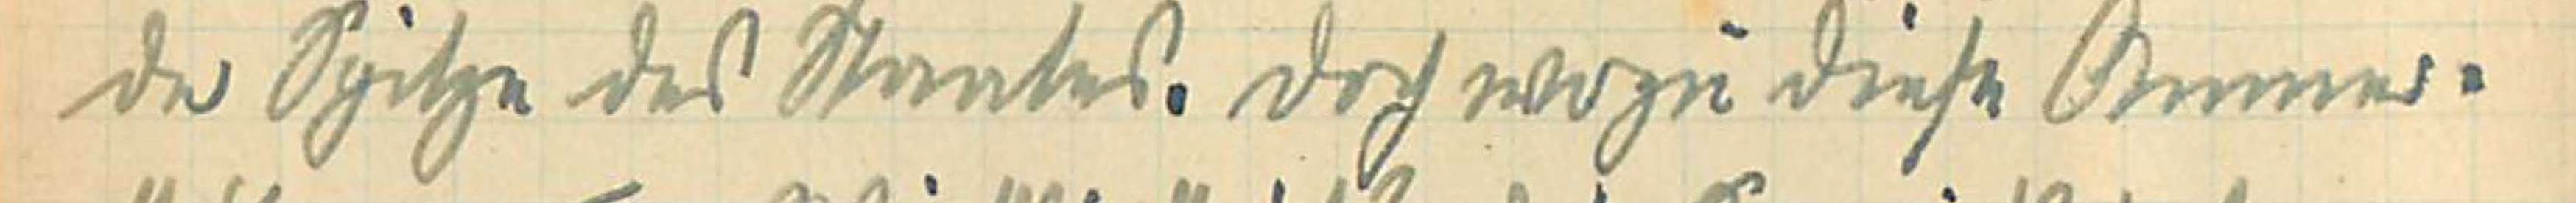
der Spitze des Staates. Doch wozu diese Anmer-
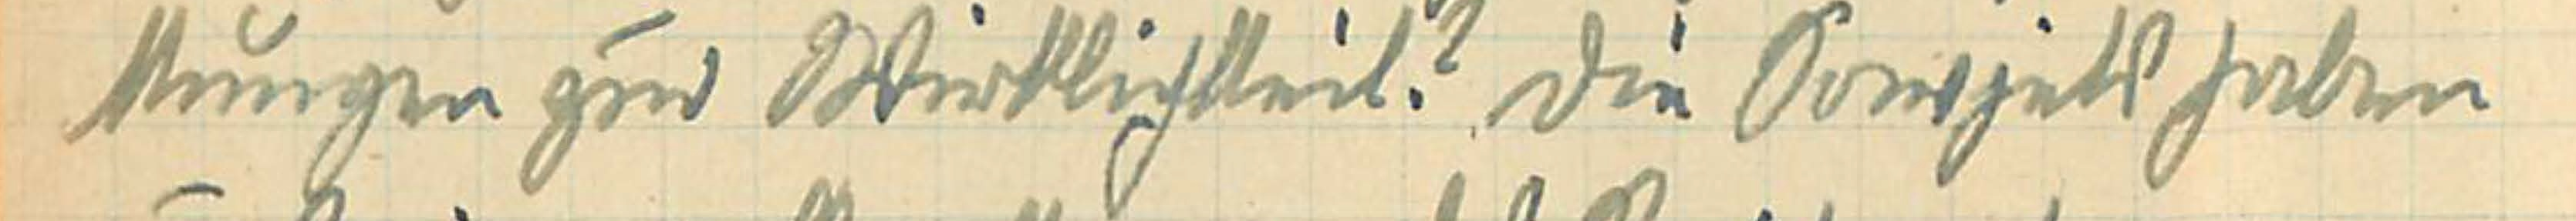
kungen zur Wirklichkeit? Die Sowjets haben
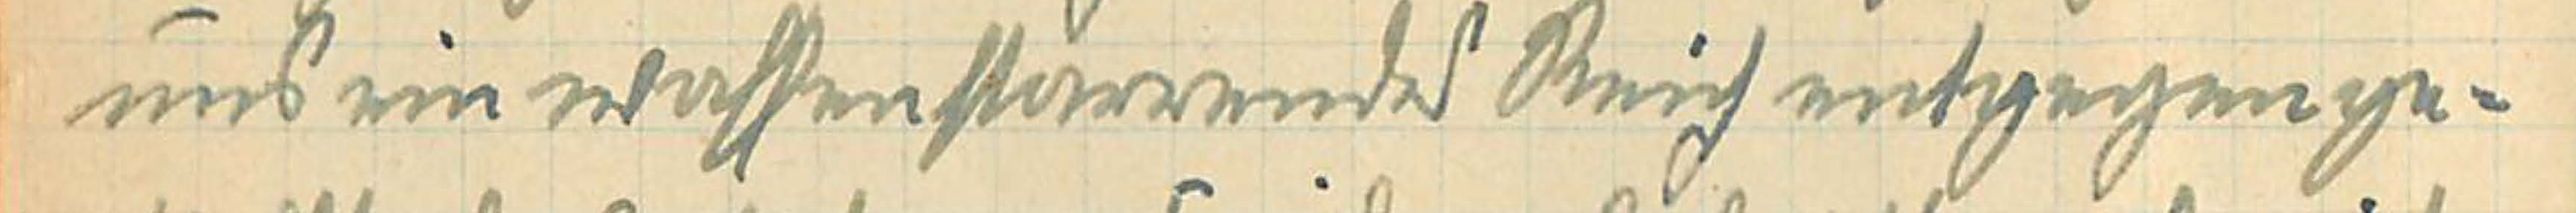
uns ein waffenstarrendes Reich entgegenge-
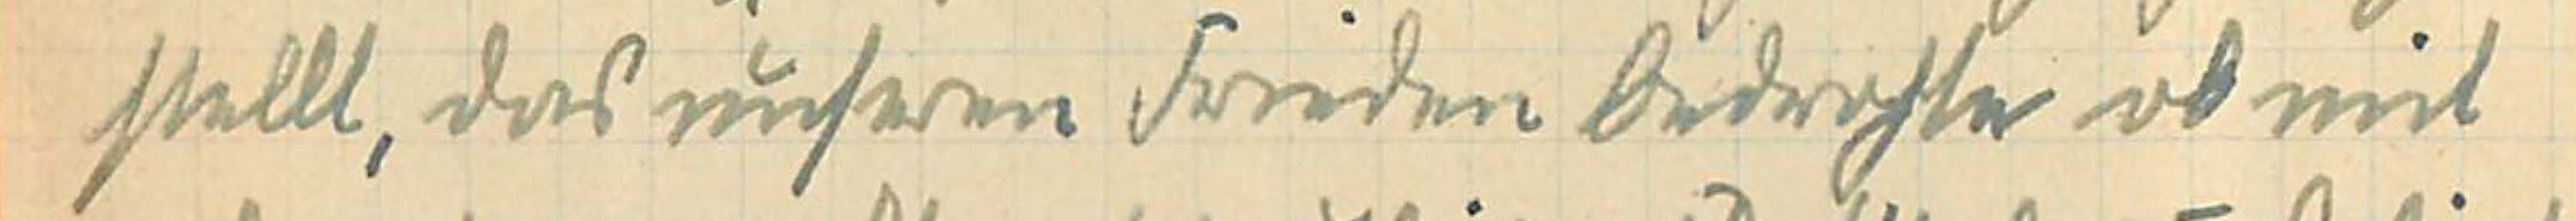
stellt, das unseren Frieden bedrohte ob mit
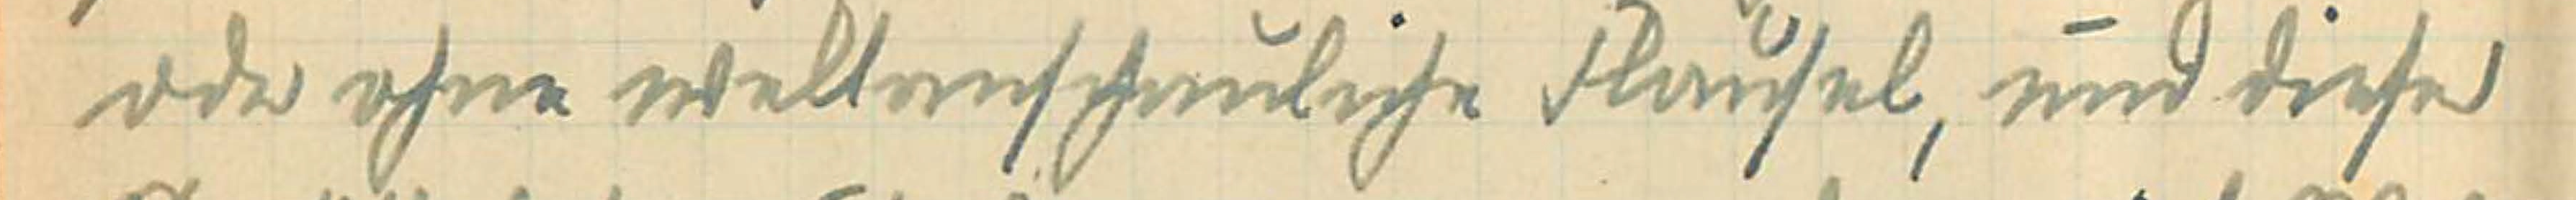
oder ohne weltanschauliche Flausel, und dieser
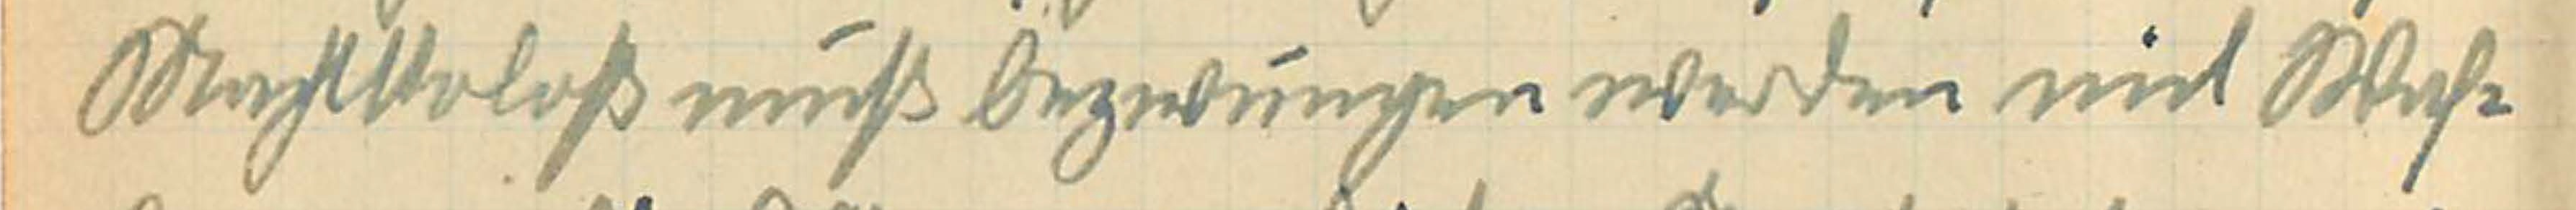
Machtkoloß muß bezwungen werden mit Waf-
